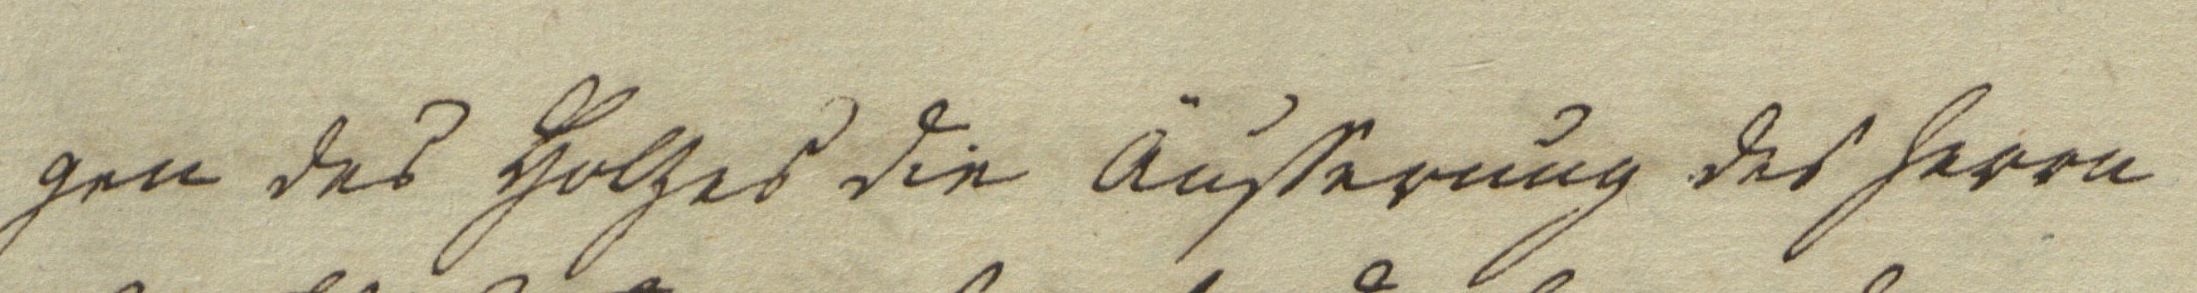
gen des Holzes die Äusserung des Herrn
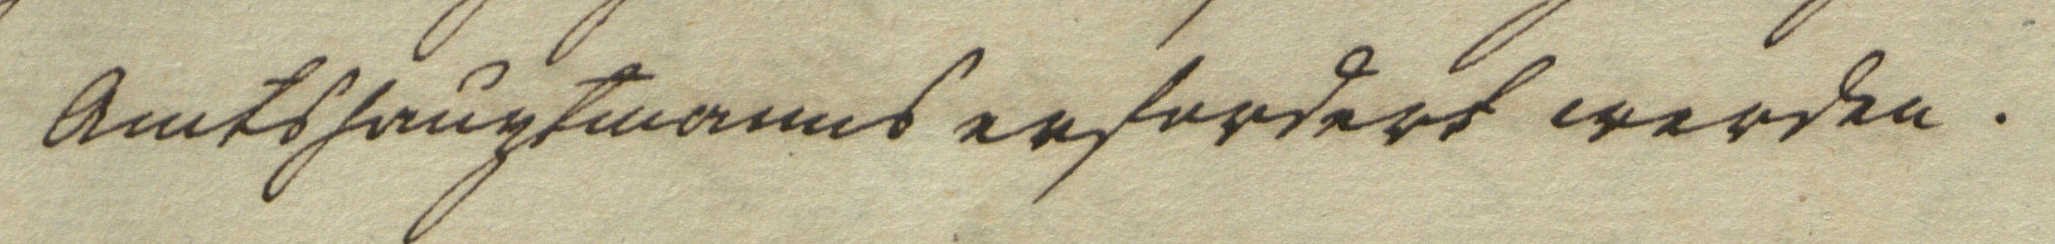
Amtshauptmanns erfordert werden.
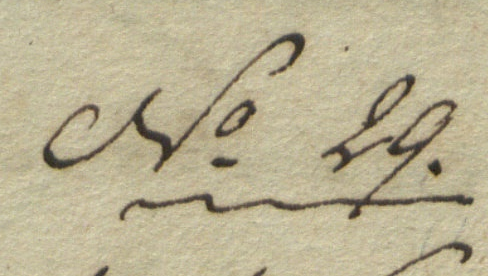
No 29.
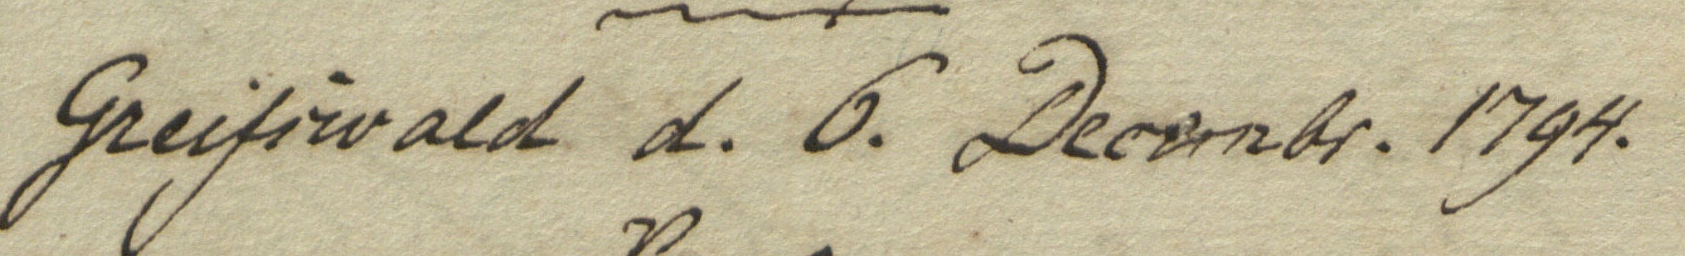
Greifswald d. 6. Decembr. 1794.
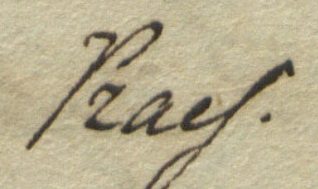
Praes.
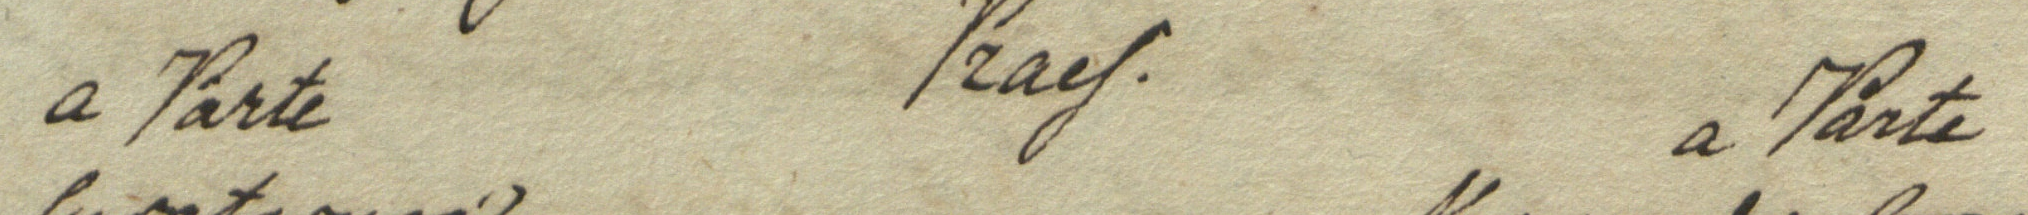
a Parte a Parte
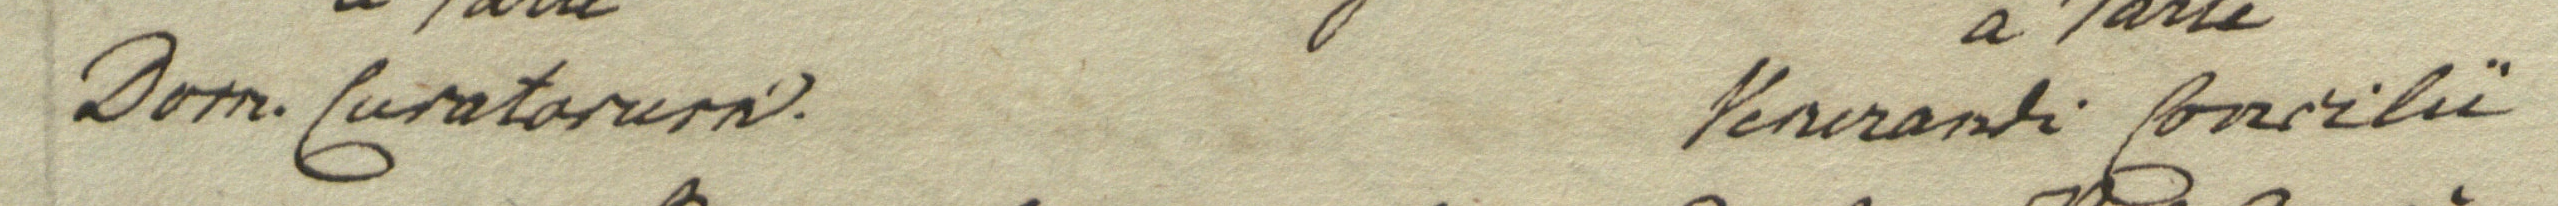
Dom. Curatorum. Venerandi Concilii
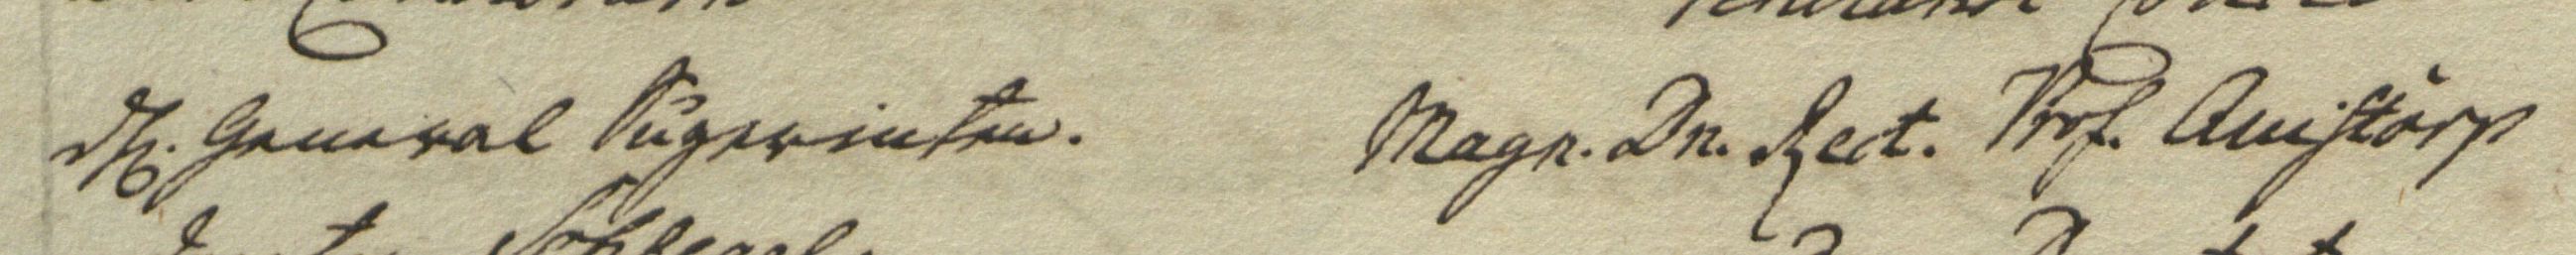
dh General Superinten¬ Magn. Dn. Rect. Prof. Quistorp
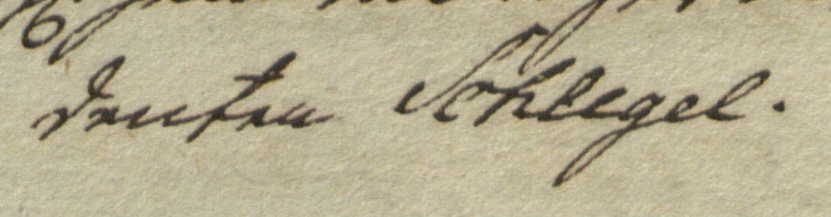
denten Schlegel.
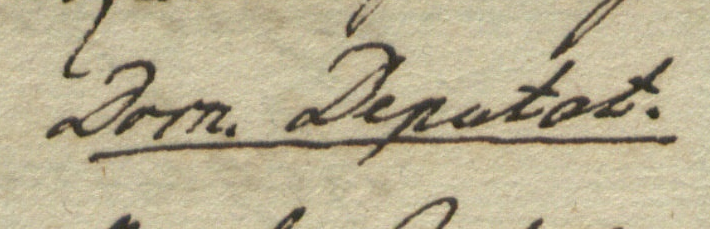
Dom. Deputat.
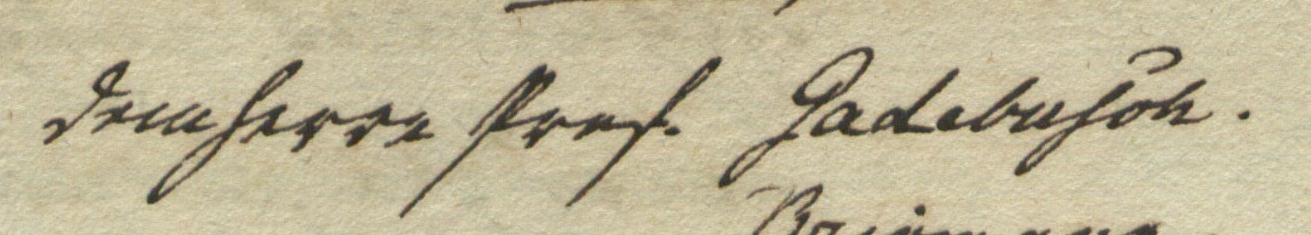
dem Herrn Prof. Gadebusch.
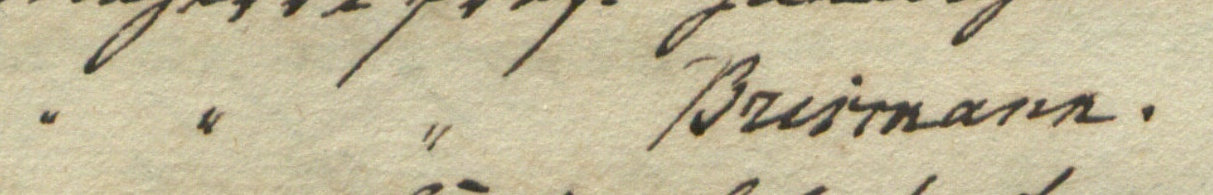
Brismann.
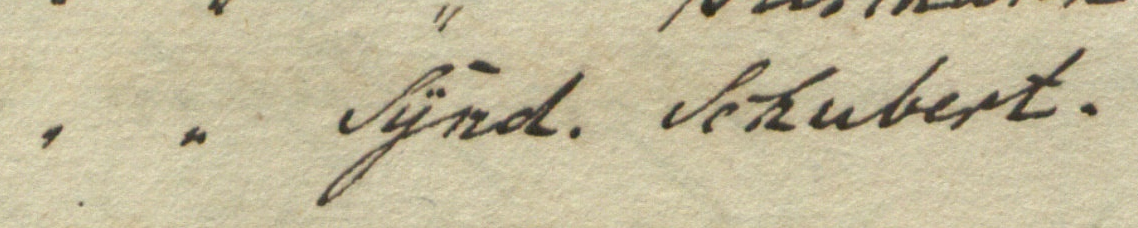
Sÿnd. Schubert.
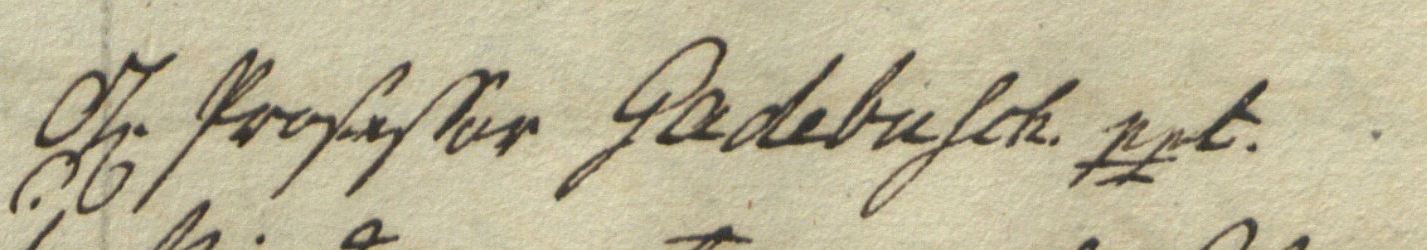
dh. Professor Gadebusch ppt.
